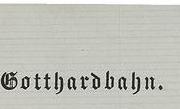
Gotthardbahn.
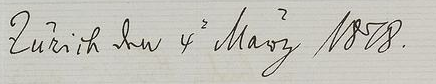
Zürich den4t März 1878.
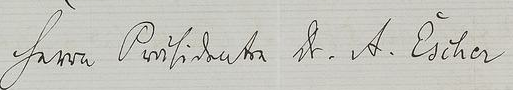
Herrn Präsidenten Dr. A. Escher
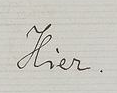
Hier.
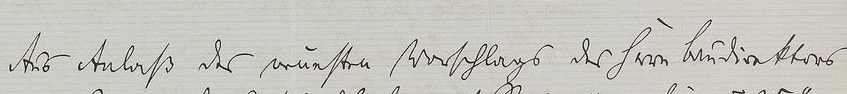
Aus Anlaß des neuesten Vorschlags des Herrn Baudirektors
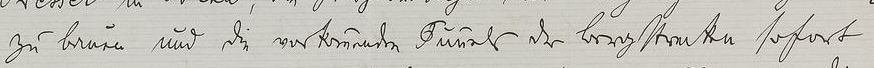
zu bauen und die vorkommenden Tunnels der Bergstrecken sofort
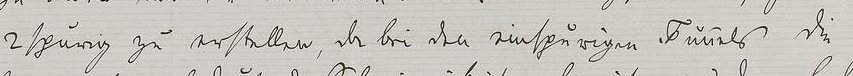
2spurig zu erstellen, da bei den einspurigen Tunnels die
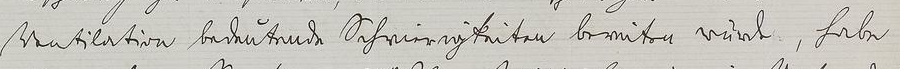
Ventilation bedeutende Schwierigkeiten bereiten würde, habe
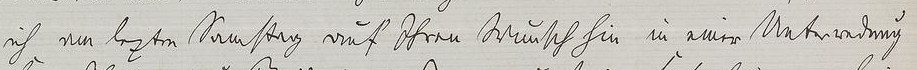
ich am lezten Samstag auf Ihren Wunsch hin in einer Unterredung
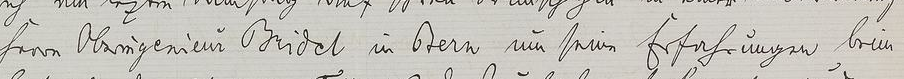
Herrn Oberingenieur Bridel in Bern um seine Erfahrungen beim
